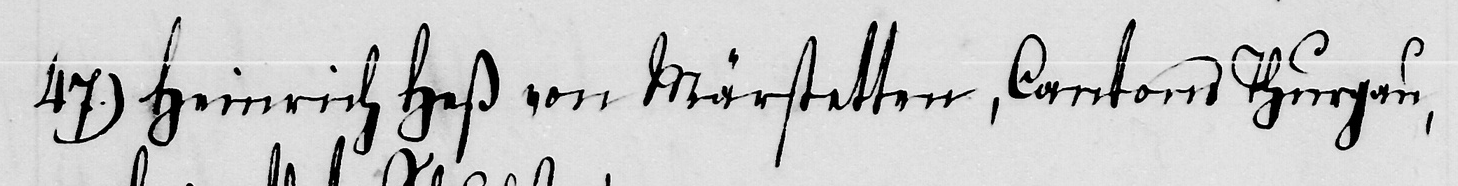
47.) Heinrich Heß von Märstetten, Cantons Thurgau,
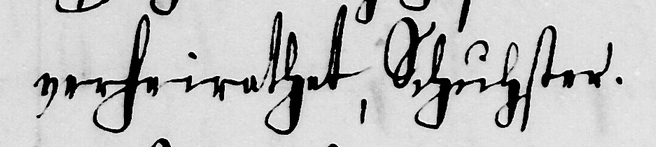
verheirathet, Schuhster.
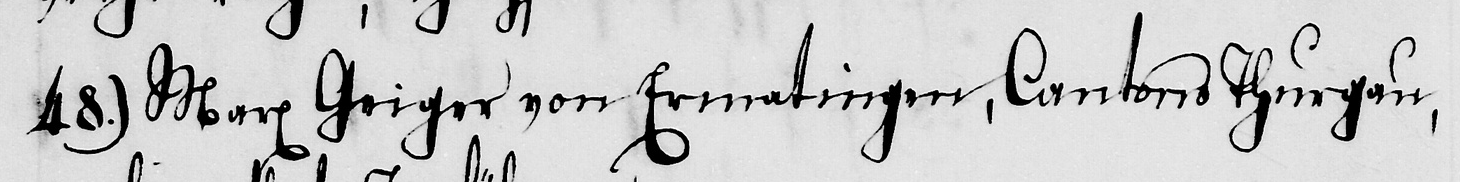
48.) Marx Geiger von Ermatingen, Cantons Thurgau,
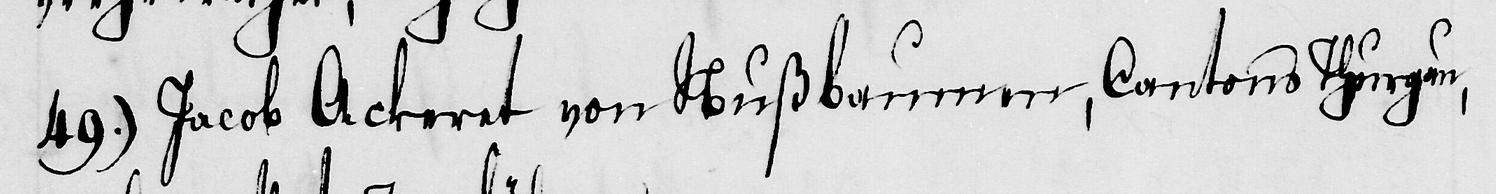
49.) Jacob Ackeret von Nußbaumen, Cantons Thurgau,
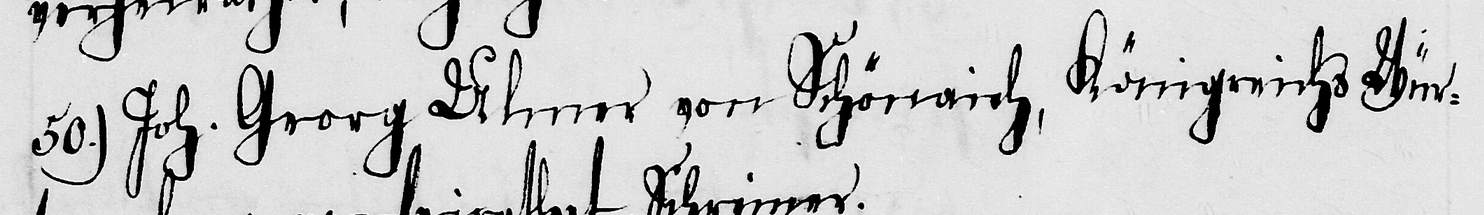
50.) Joh. Georg Ulmer von Schönaich, Königreichs Wür¬
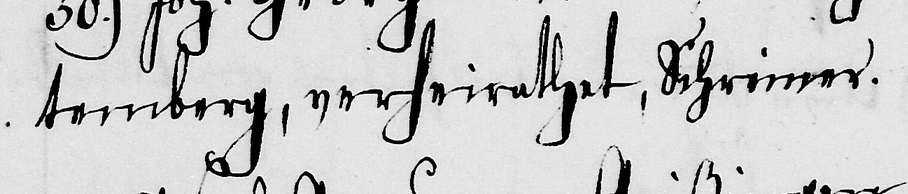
temberg, verheirathet, Schreiner.
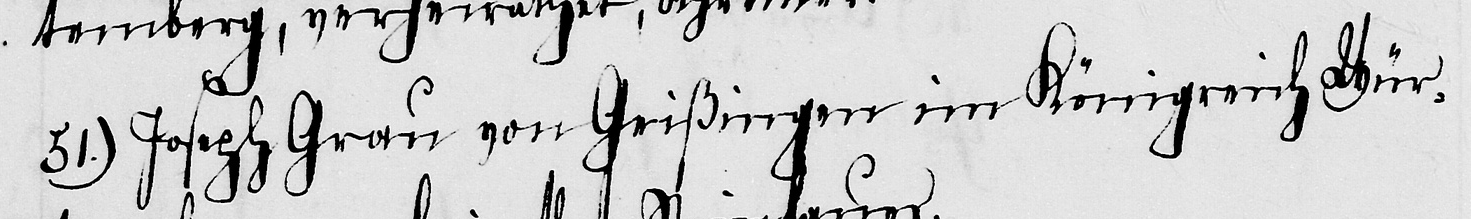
51.) Joseph Grau von Geißingen im Königreich Wür¬
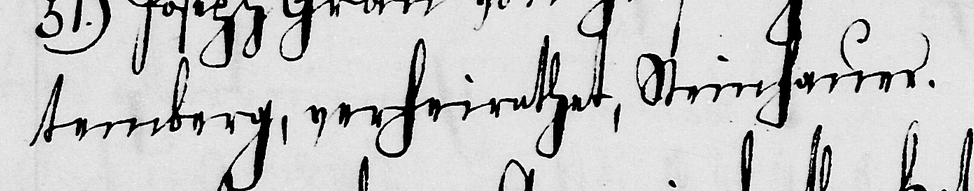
temberg, verheirathet, Steinhauer.
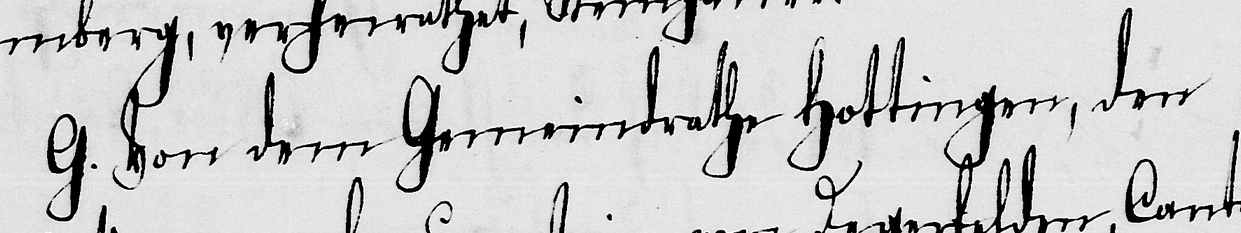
G. Von dem Gemeindrathe Hottingen, den
